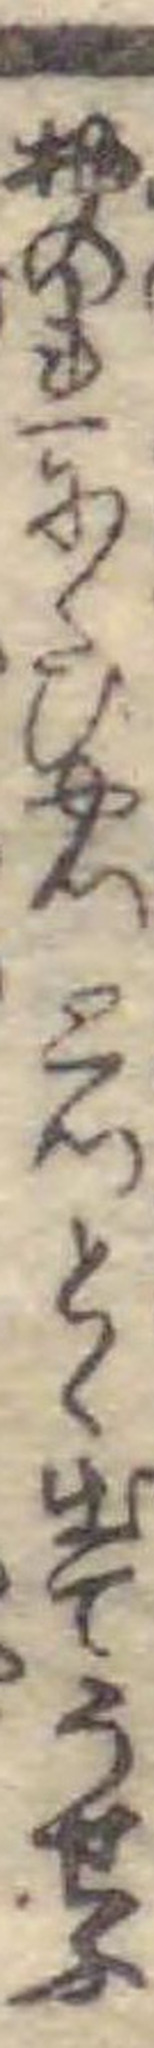おのれにくひやつとつとゝ出てうせふ
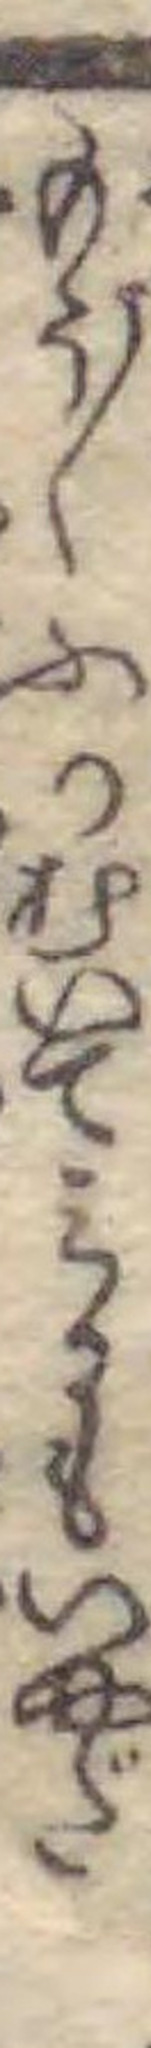もう〳〵ふりむいてみるもいやだ
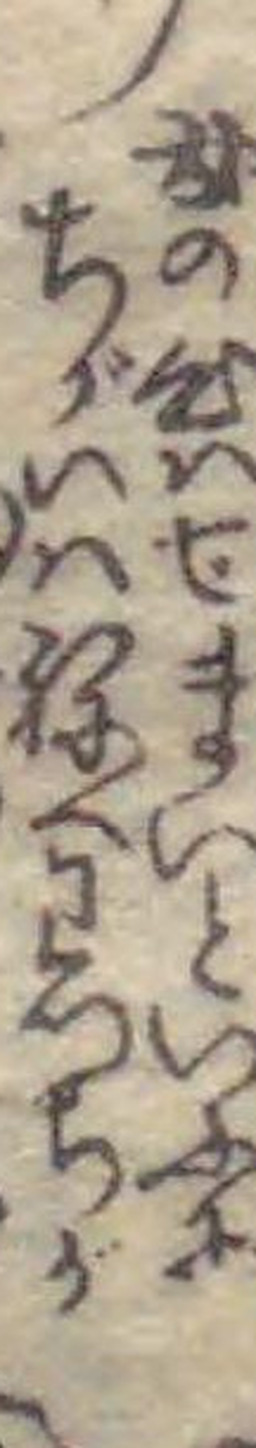ちがいはねへわつちが
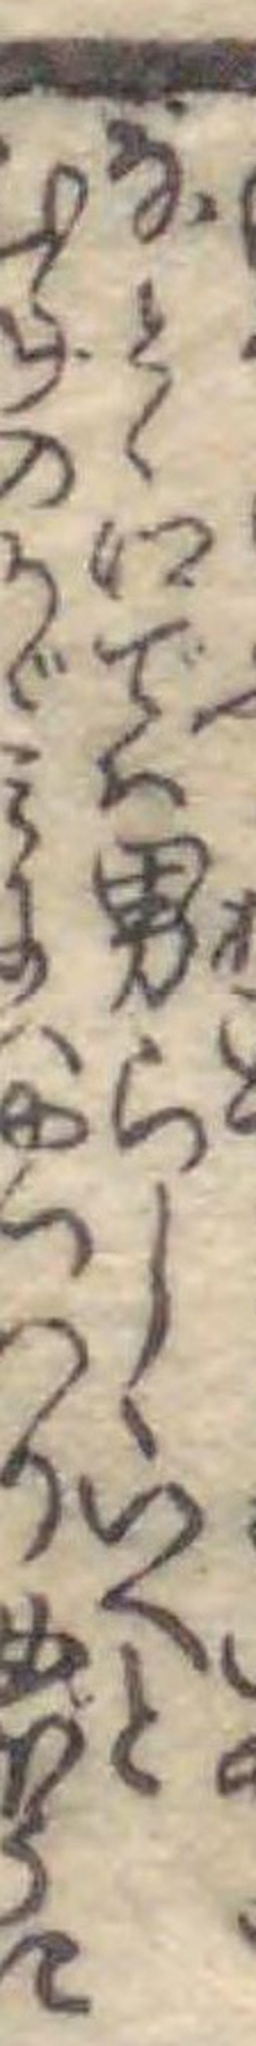むねのかゞみにはやつはり女ぼうに
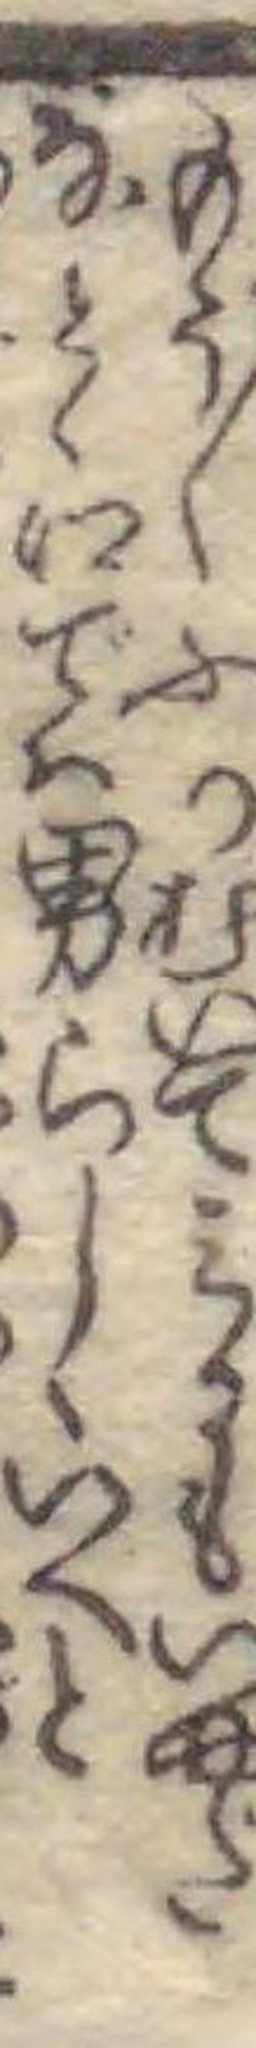なとゝ口では男らしくいへと
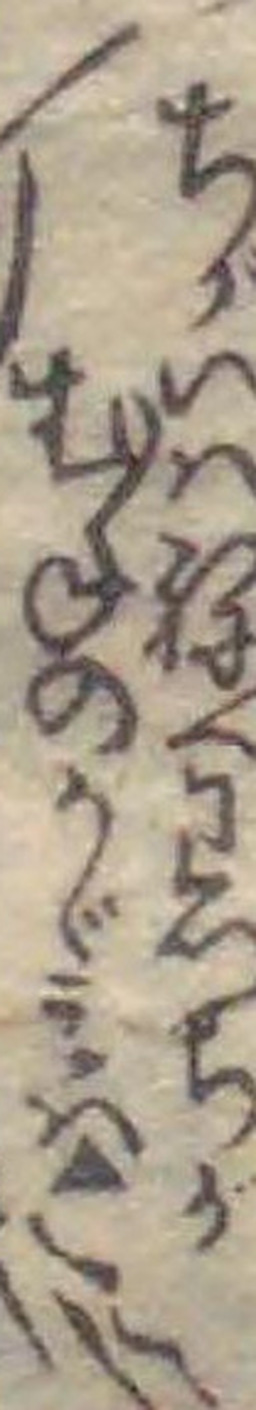むねのかゞみは▲
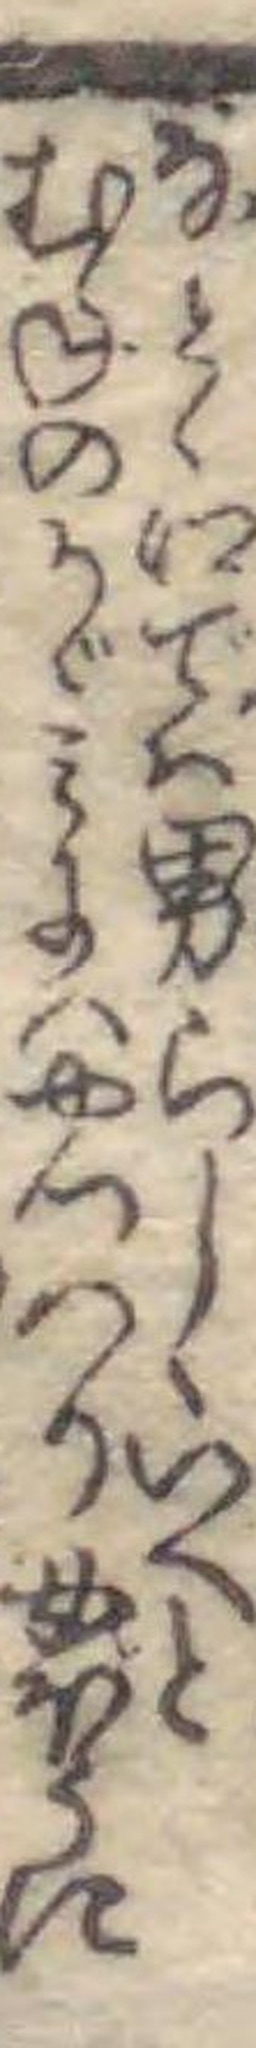むねのかゞみにはやつはり女ぼうに
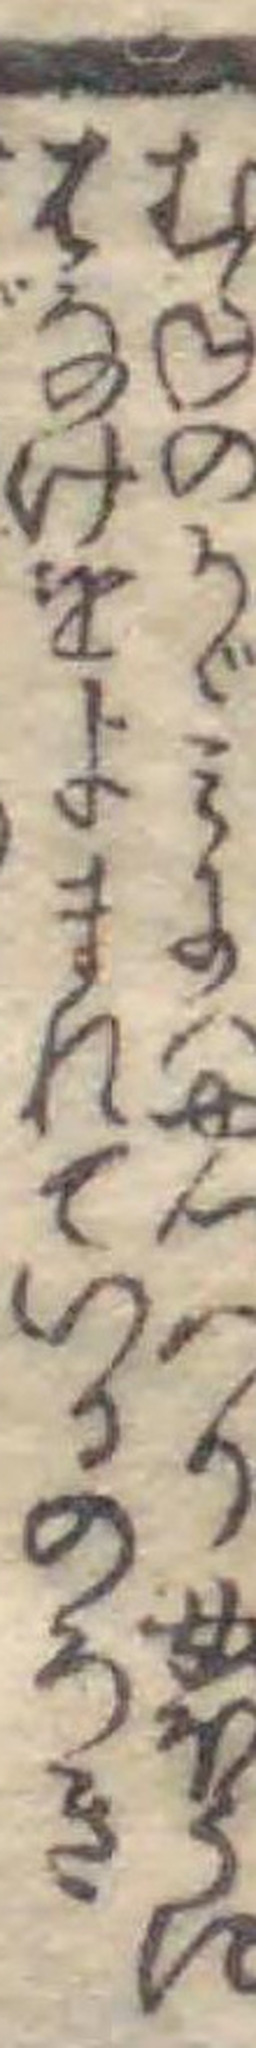はなけをよまれているのろき
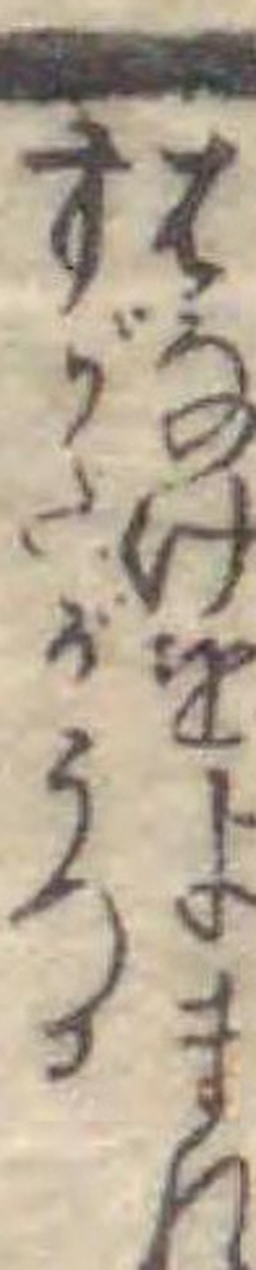すがたがうつる
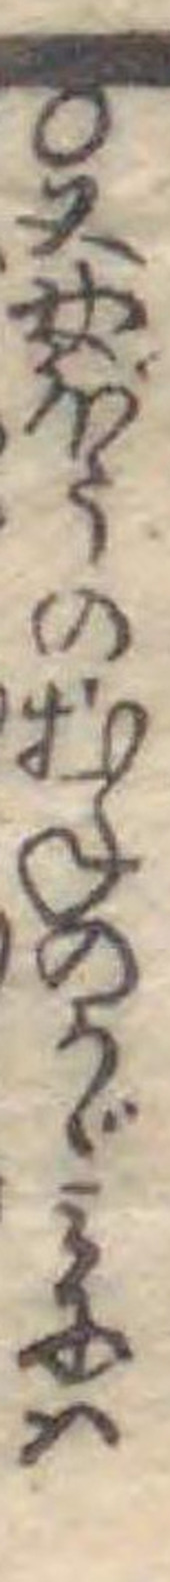○又女ぼうのむねのかゞみには
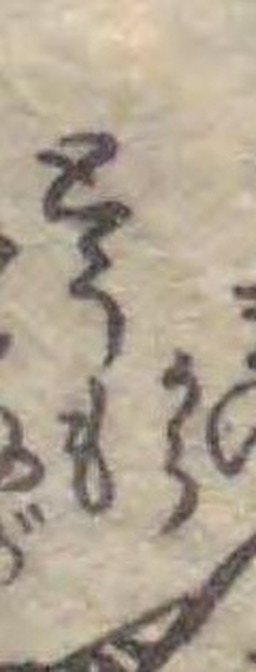とうも
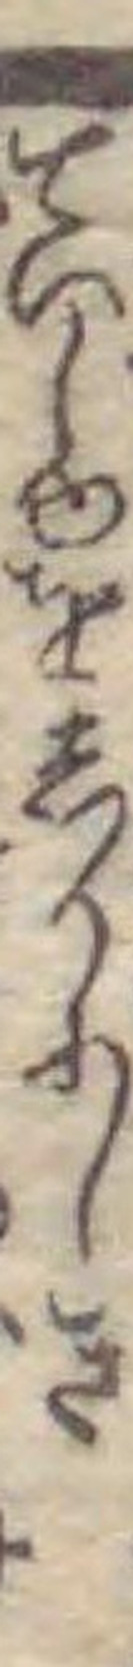ていしゆをしりにしき
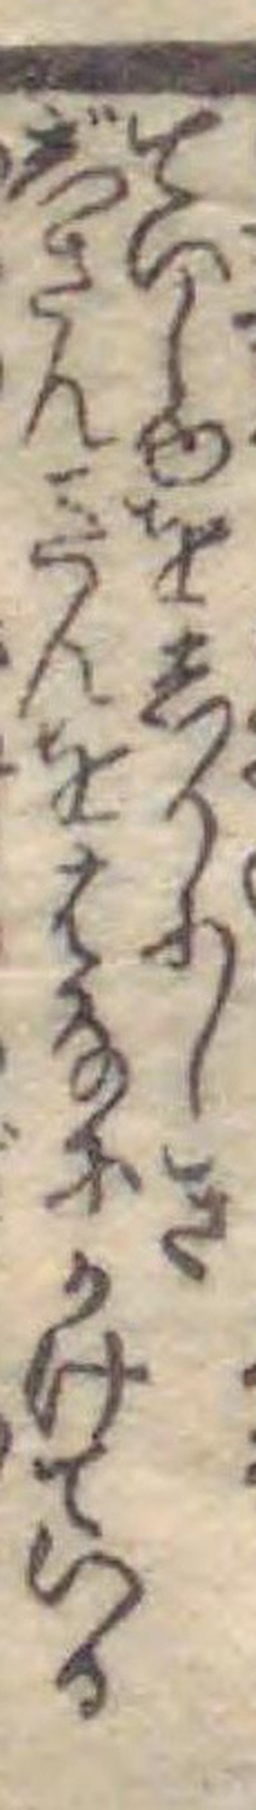じさんきんをはなにかけている
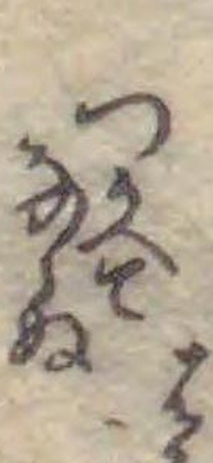つかへて
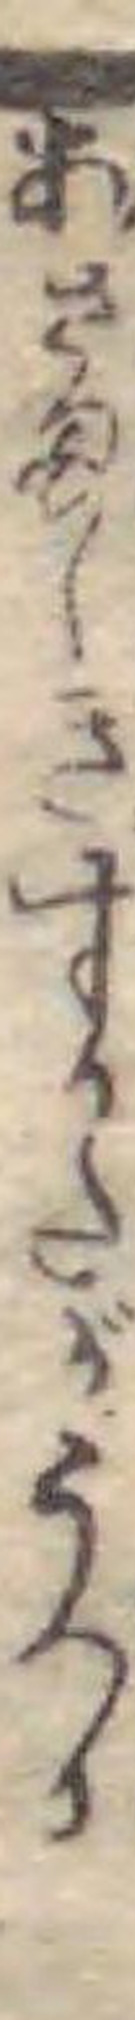あさましきすかたがうつる
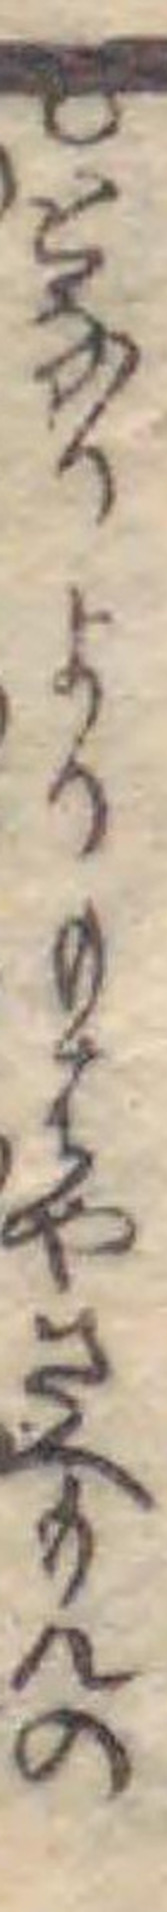○となりよりもはやさへもんの
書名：人心鏡写絵 : 3巻
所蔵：国立国会図書館 National Diet Library, JAPAN
